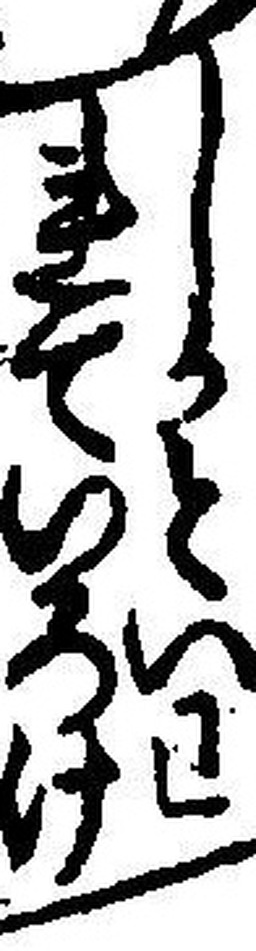れていろけ
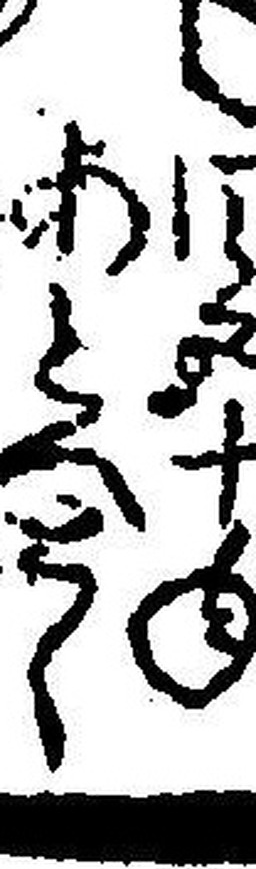あとへとし
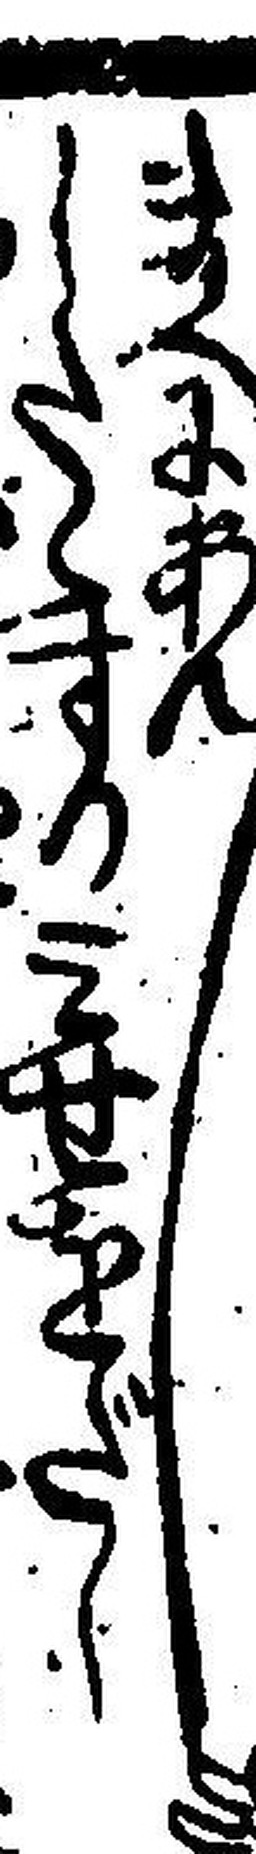したくすりみせをだし
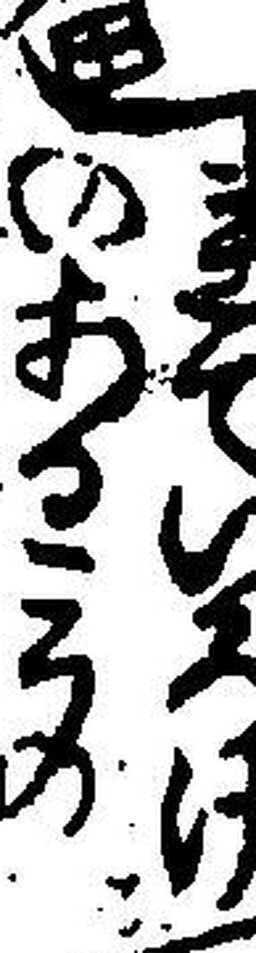のあるみの
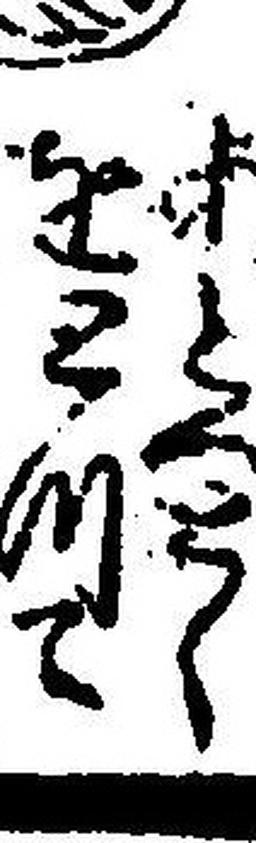をとつて
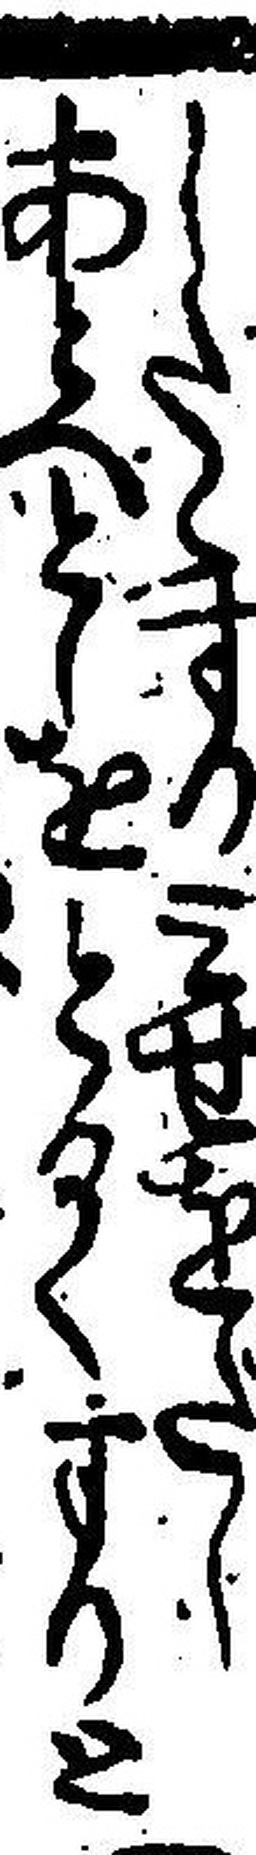あとへとしをとるくすりと
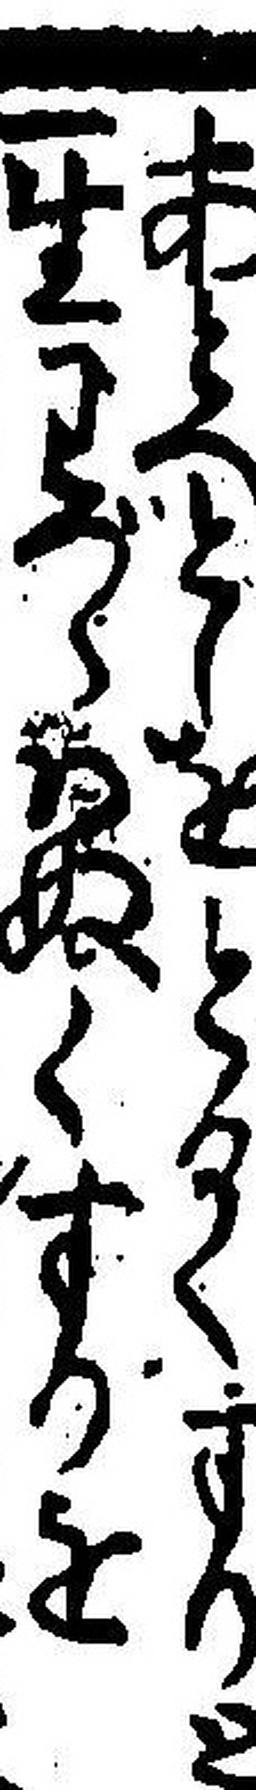一生わづらはぬくすりを
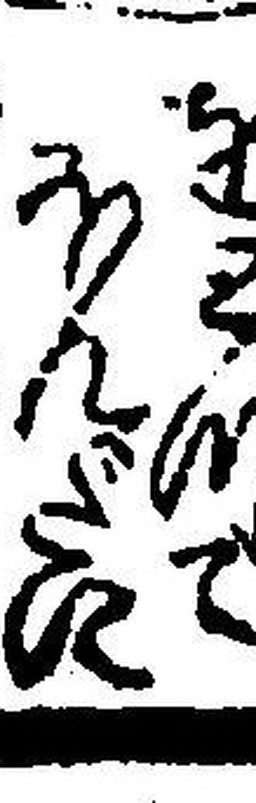ほんだに
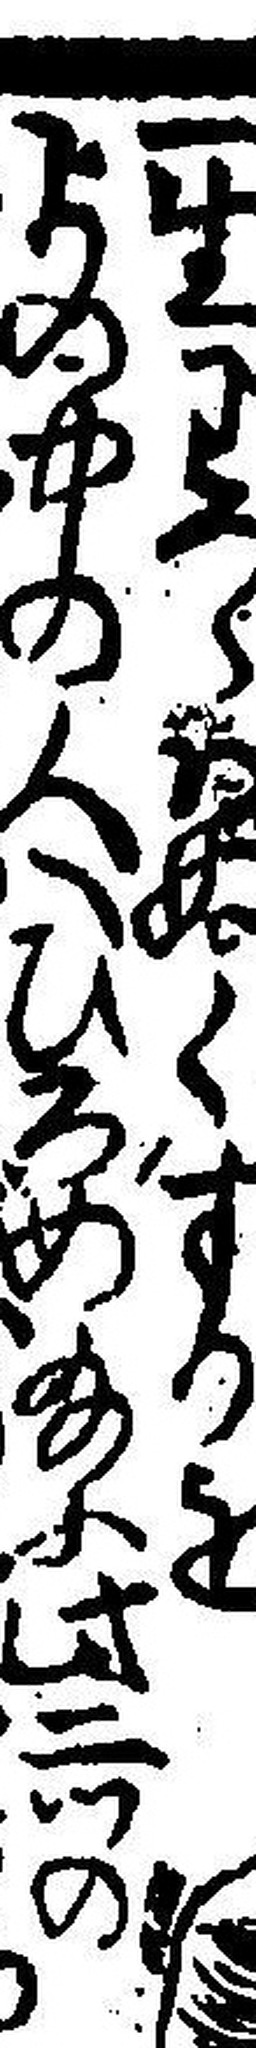よの中の人へひろめ給ふ此二つの
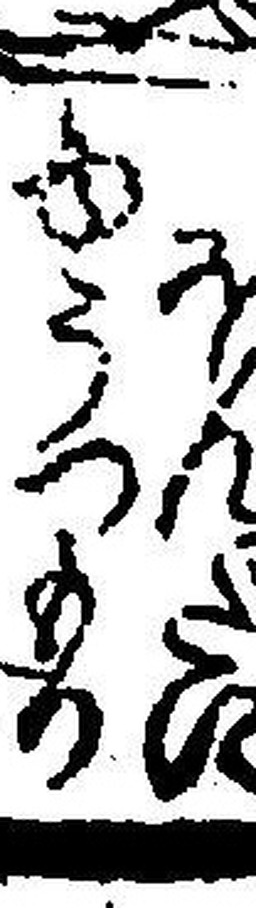ゆうつもり
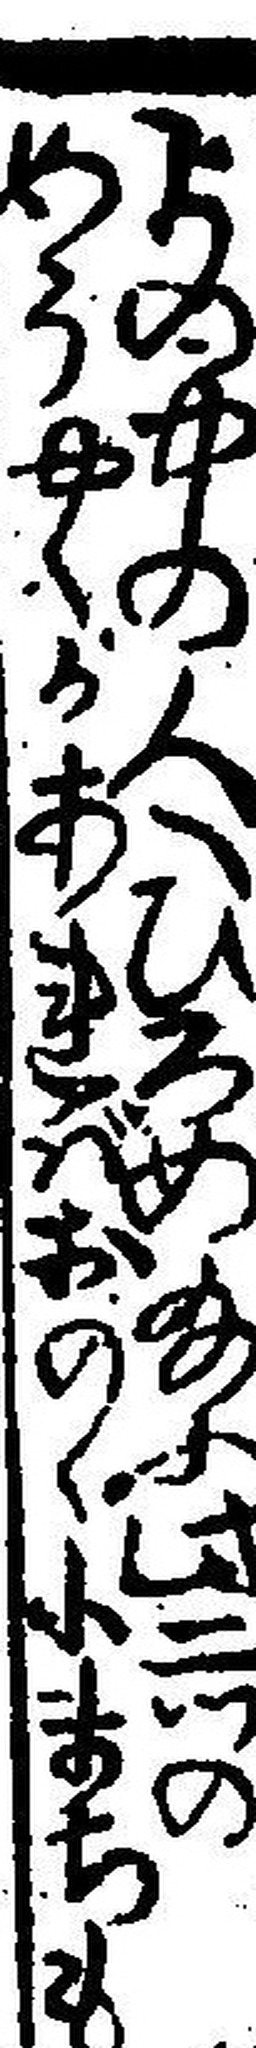めうやくがあればおのゝ小まちも
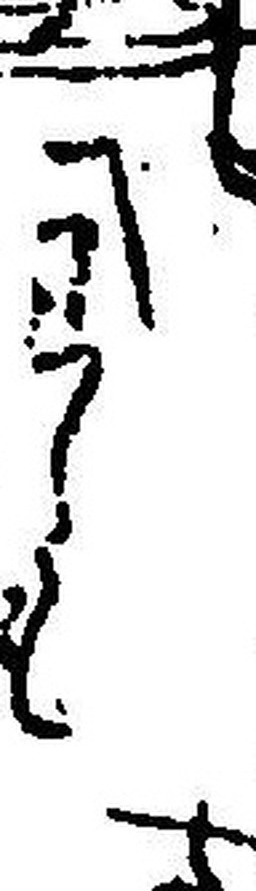〽わしも
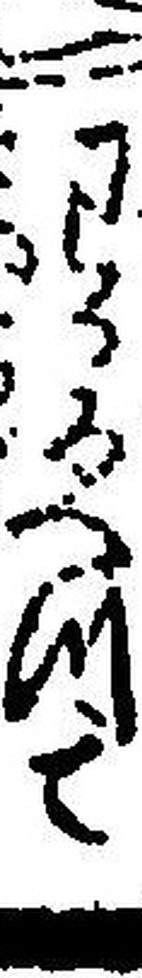わかかへつて
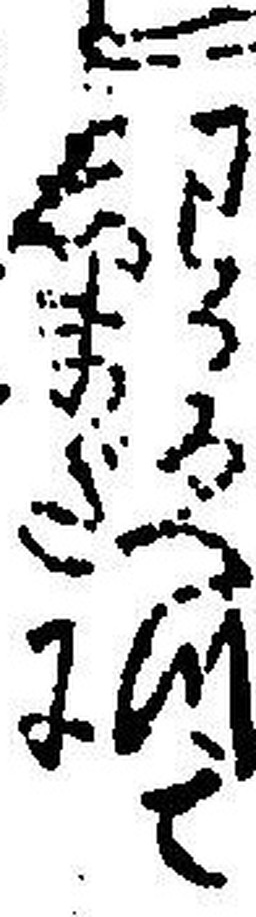しまだに
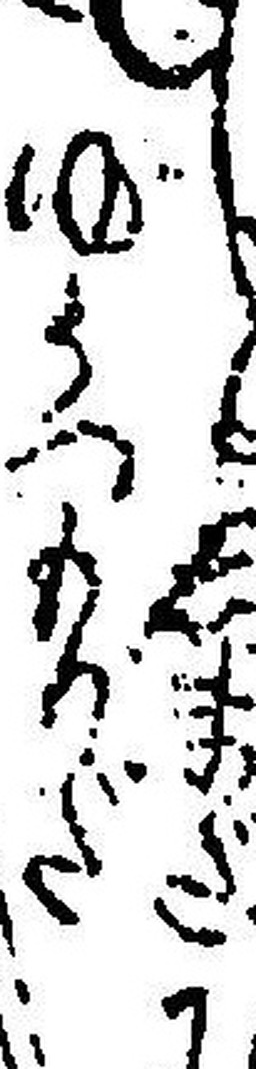ゆうつもりだ
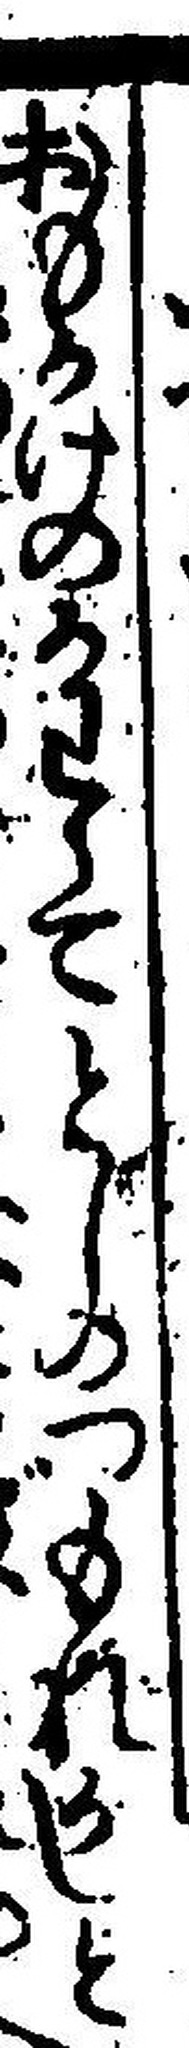おもかけのかわらてとしのつもれかしと
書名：徳若水縁起金性 / 樹下石上作
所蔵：東京大学総合図書館 General Library in the University of Tokyo, JAPAN
